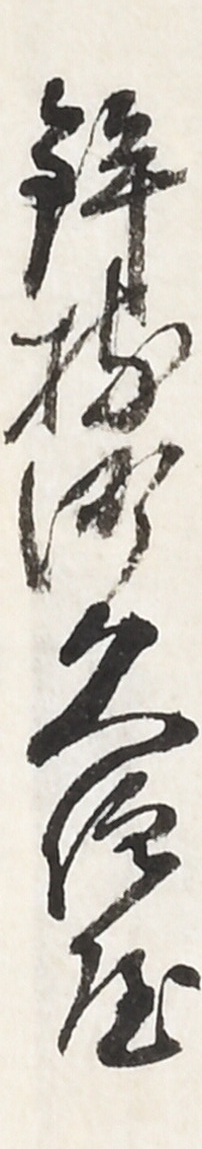鉾持町久住屋
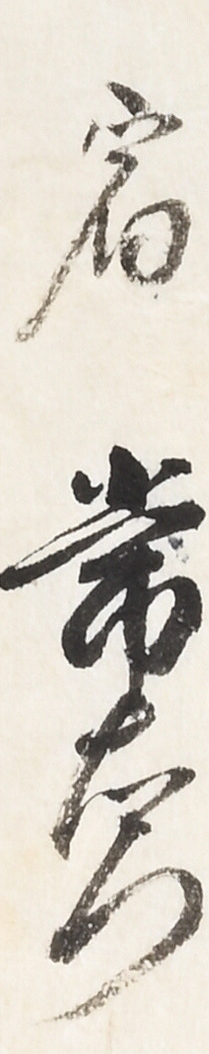宿常右衛門
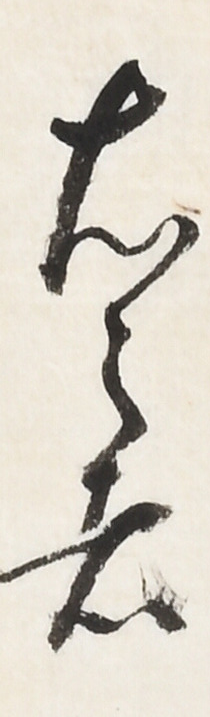右之者
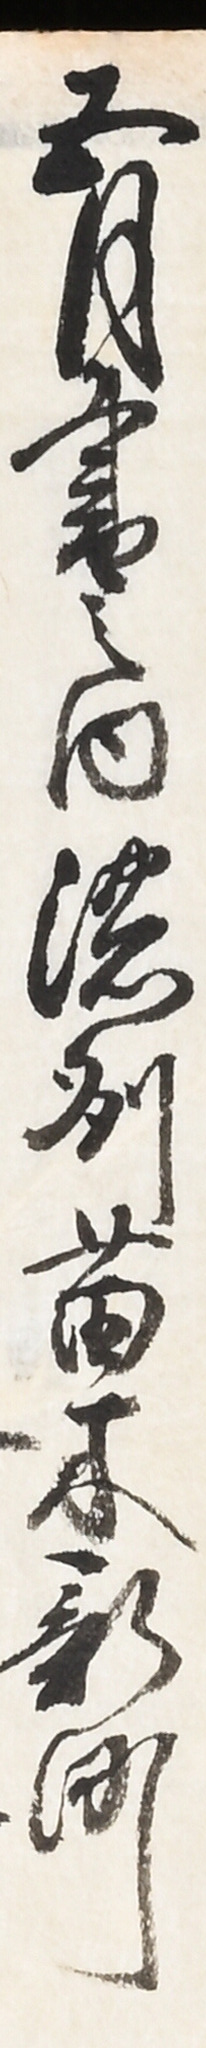五月書之内濃州苗木新町
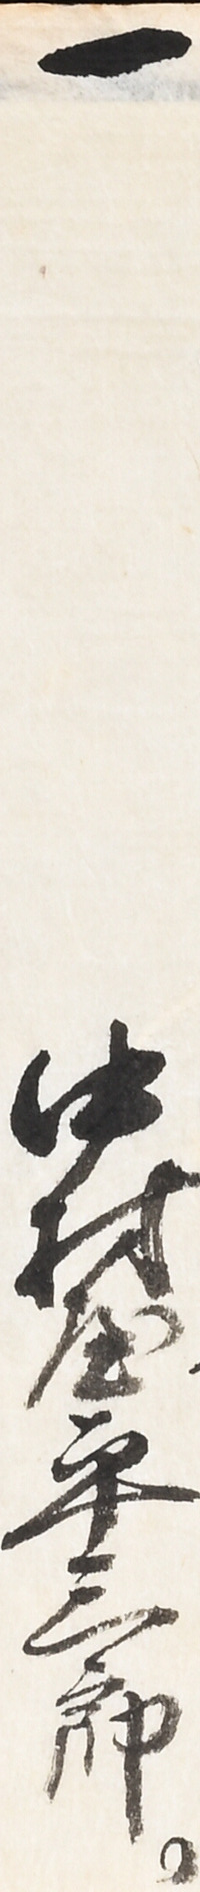一中村屋平三郎〇
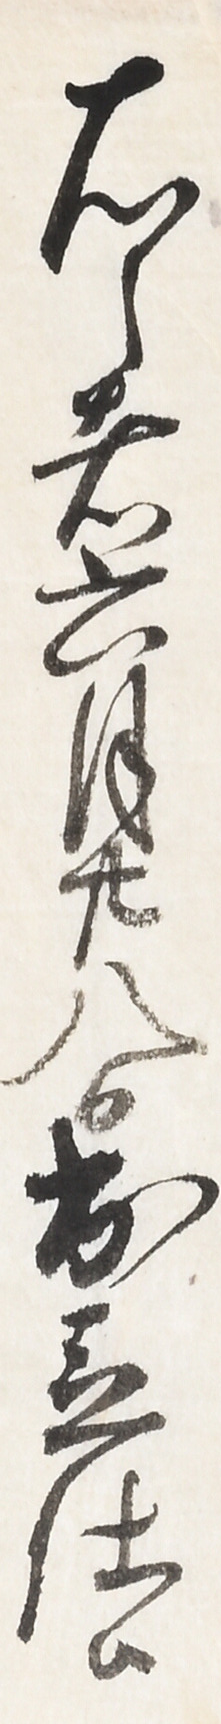右之者六月廿八日出立仕候
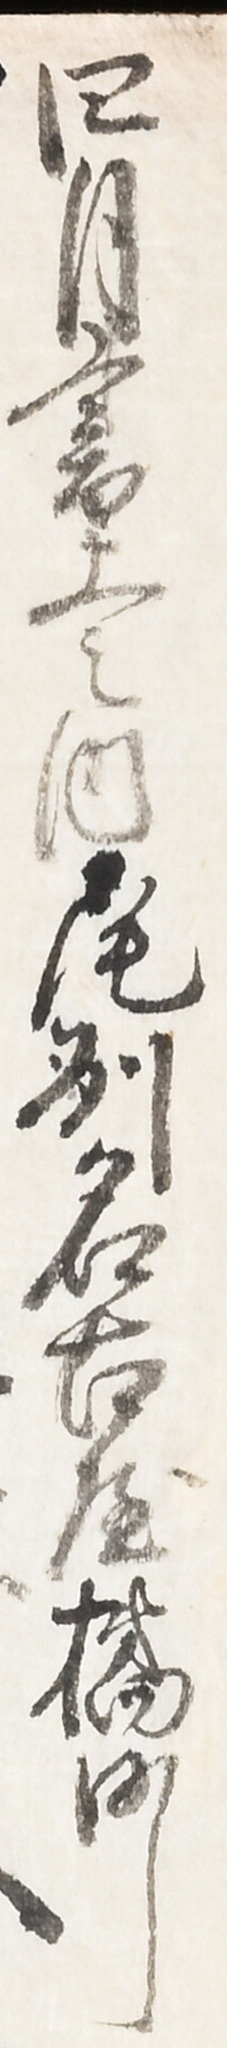四月書上之内尾州名古屋橘町
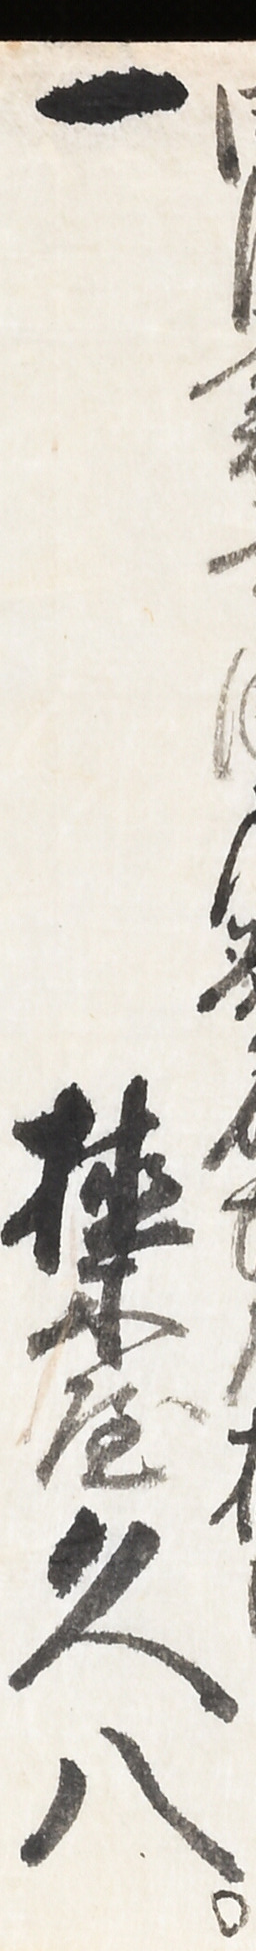一植木屋久八〇
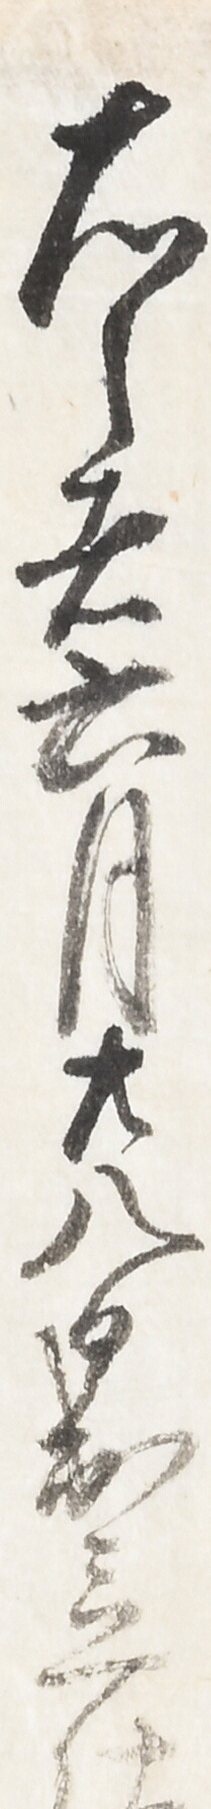右之者六月廿八日出立仕候
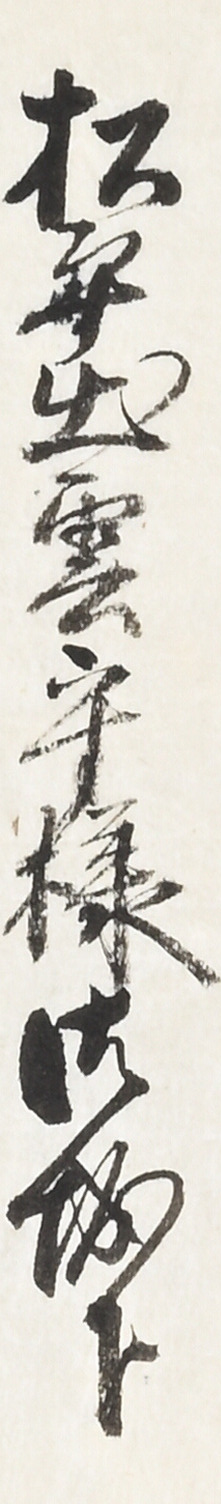松平出雲守様御城下
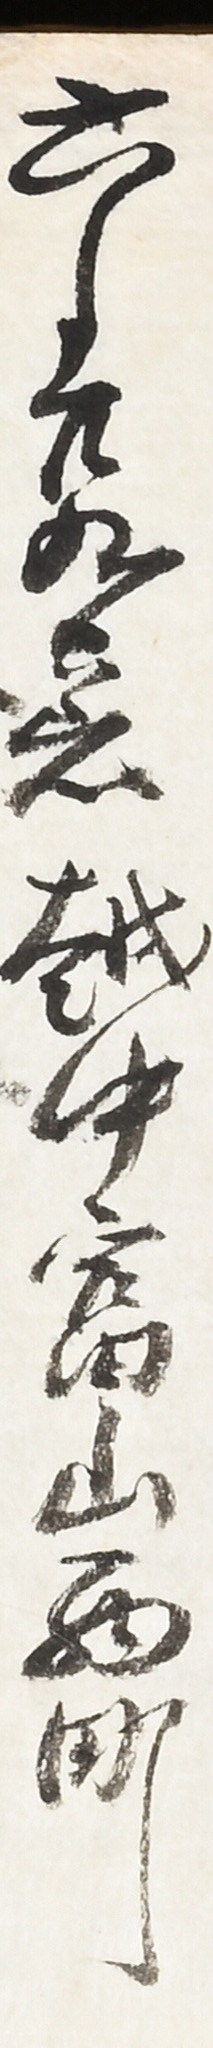六月廿九日着越中富山西町
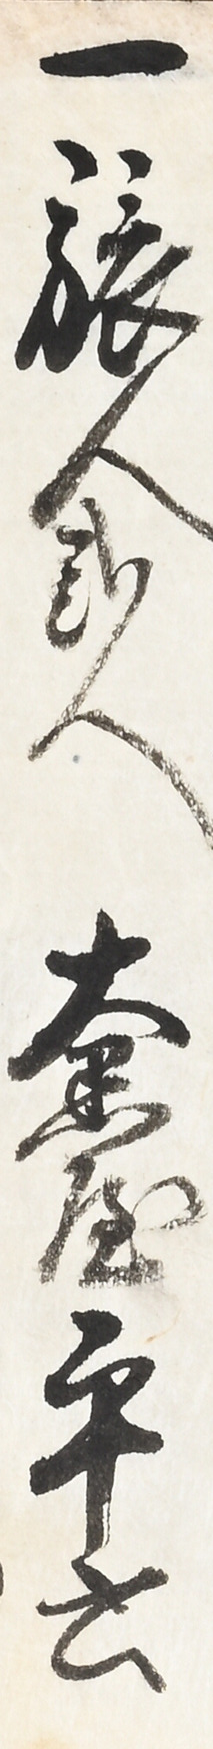一旅人弐人大黒屋平六
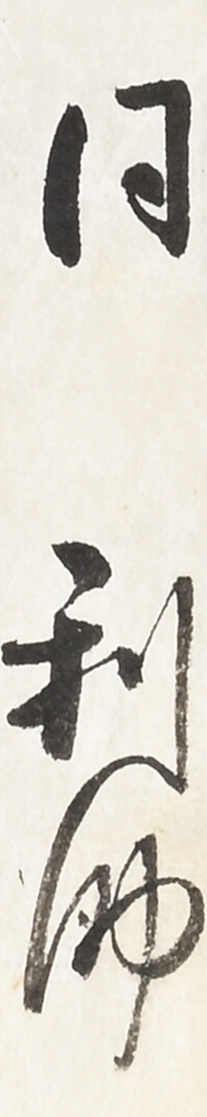同利助
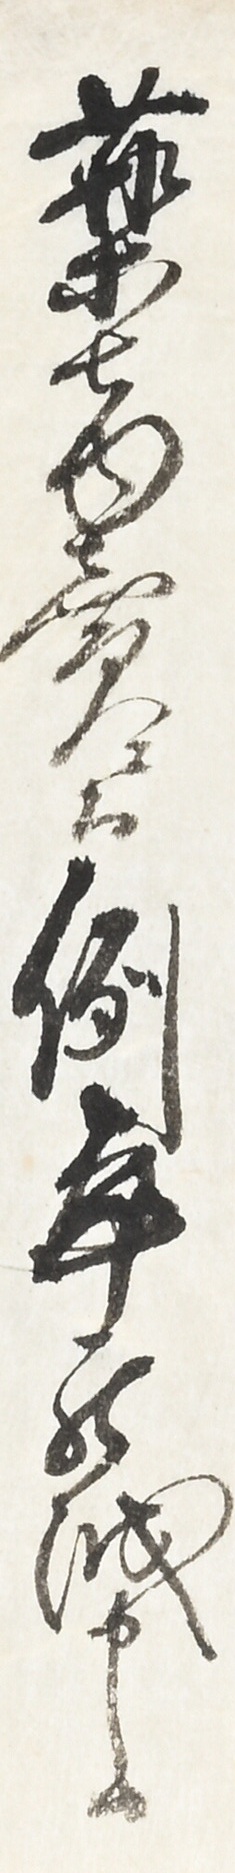薬商売ニ而例年罷越申候
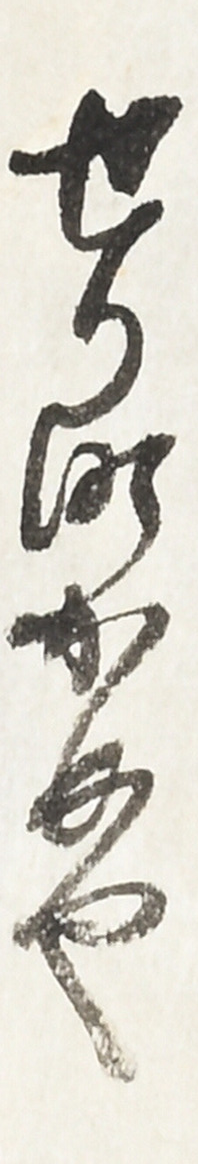せり町かみや
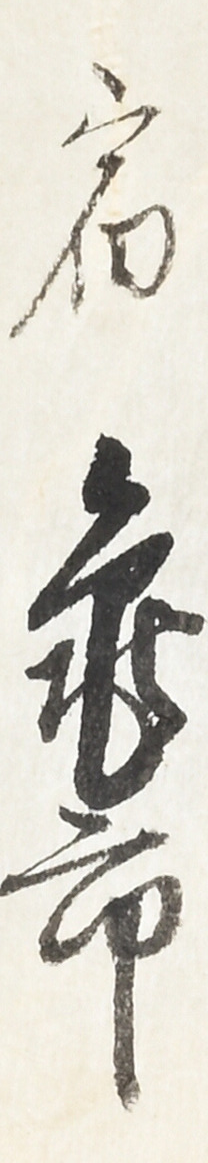宿亀市
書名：旅人泊控帳
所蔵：伊那市立高遠町図書館・合同会社AMANE
